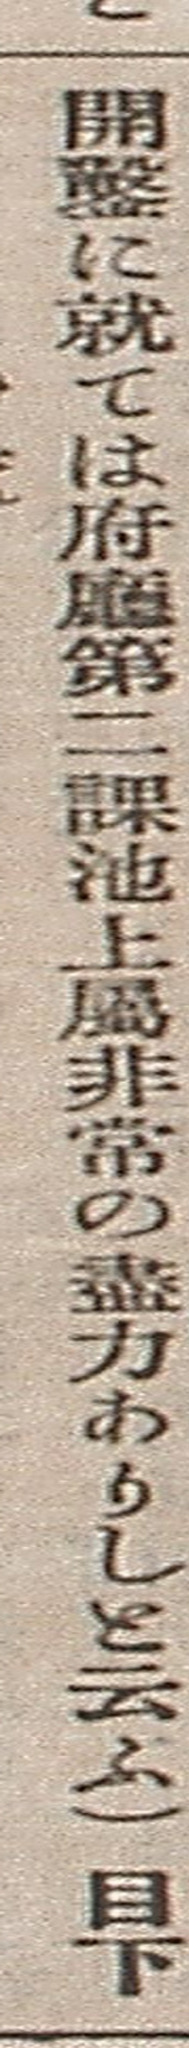開鑿に就ては府庁第二課池上属非常の尽力ありしと云ふ）目下
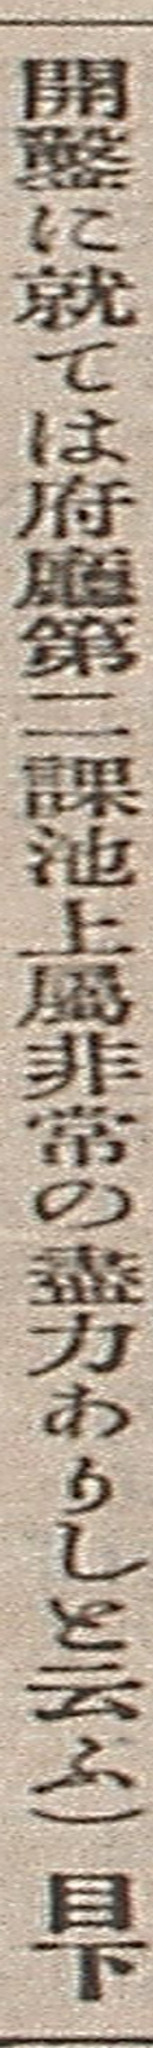開鑿に就ては府庁第二課池上属非常の尽力ありしと云ふ）目下
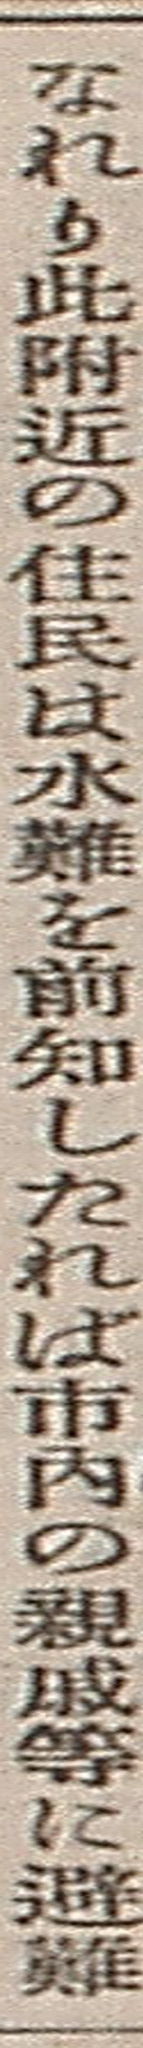なれり此附近の住民は水難を前知したれば市内の親戚等に避難
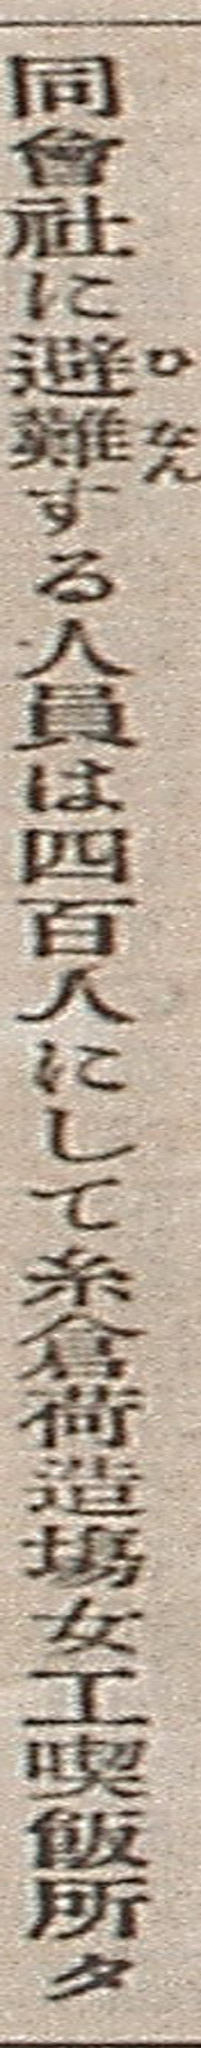同会社に避難する人員は四百人にして糸倉荷造場女工喫飯所タ
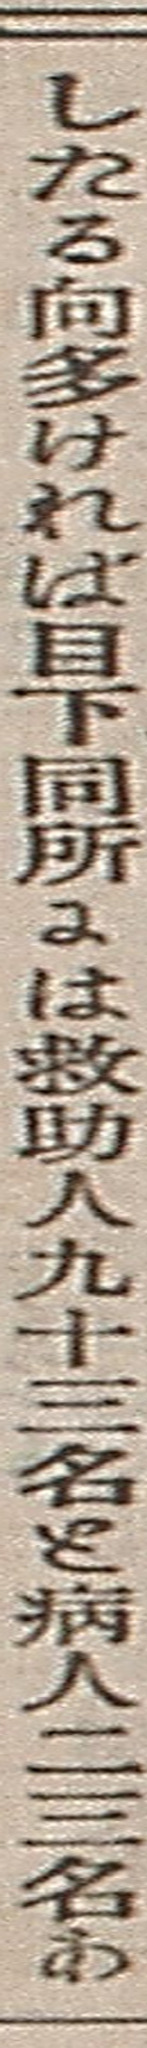したる向多ければ目下同所には救助人九十三名と病人二三名あ
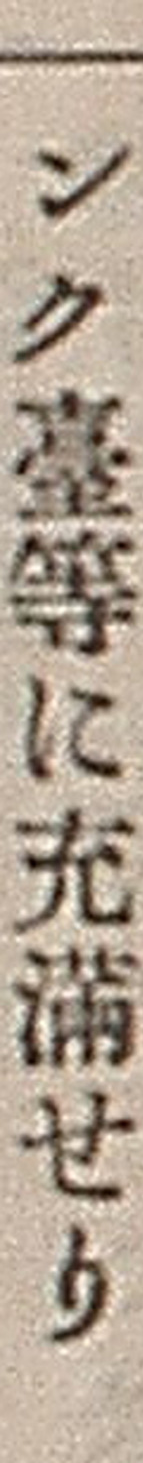ンク台等に充満せり
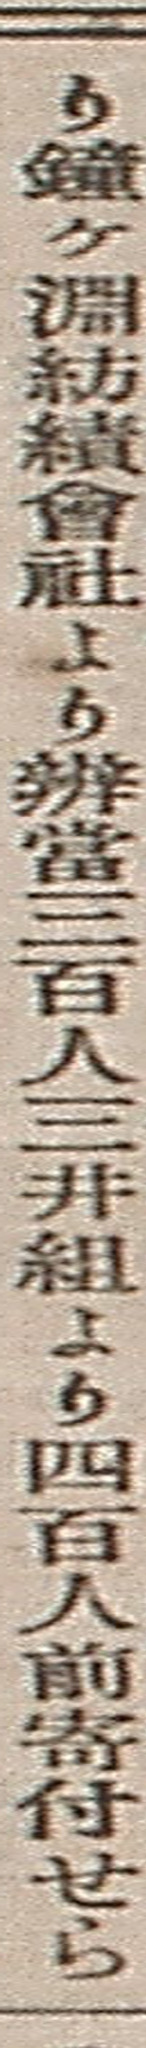り鐘ケ淵紡績会社より弁当三百人三井組より四百人前寄付せら
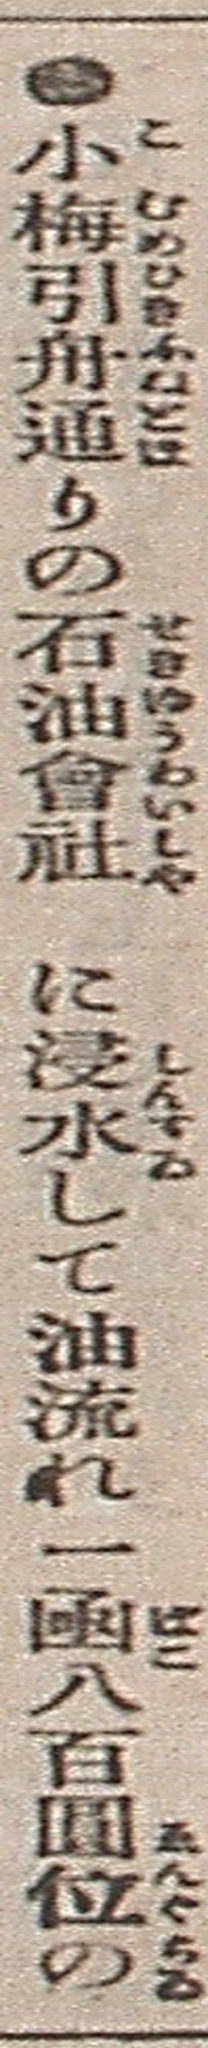●小梅引舟通りの石油会社に浸水して油流れ一函八百円位の
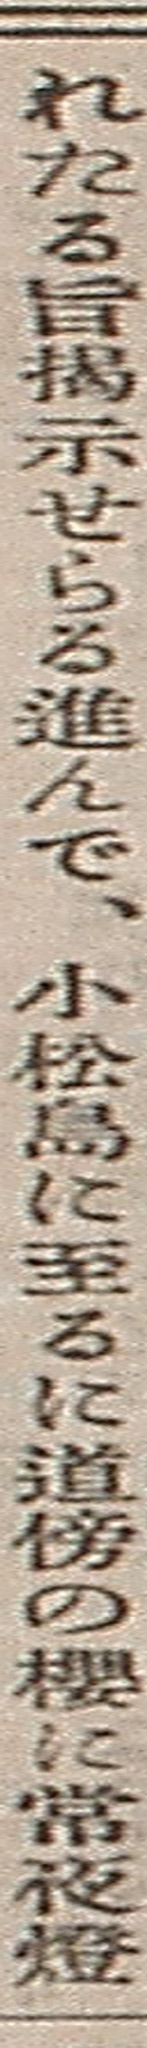れたる旨掲示せらる進んで、小松島に至るに道傍の桜に常夜燈
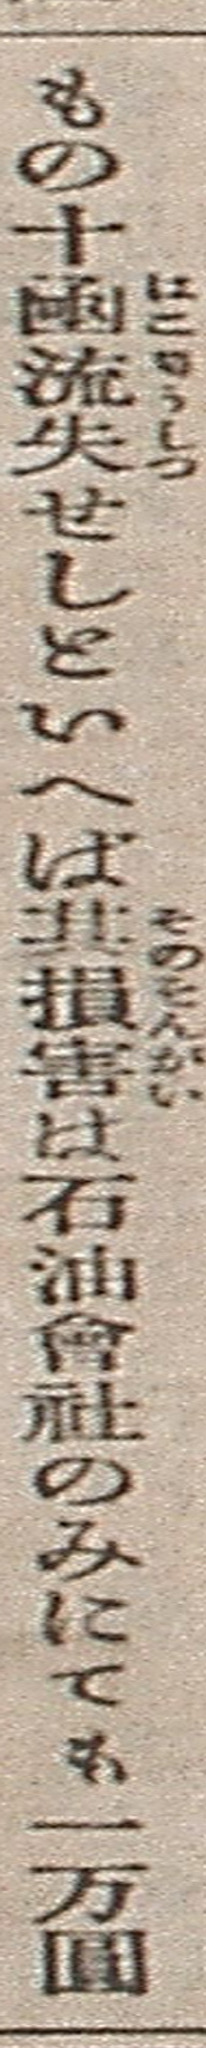もの十函流失せしといへば其損害は石油会社のみにても一万円
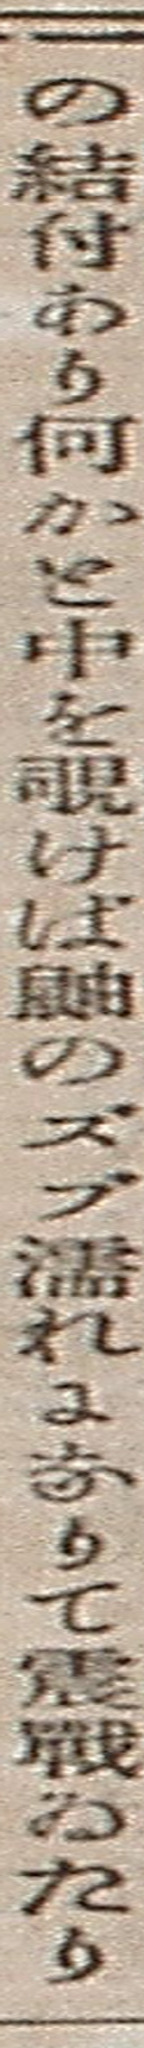の結付あり何かと中を覗けば鼬のズブ濡れになり震戦ゐたり
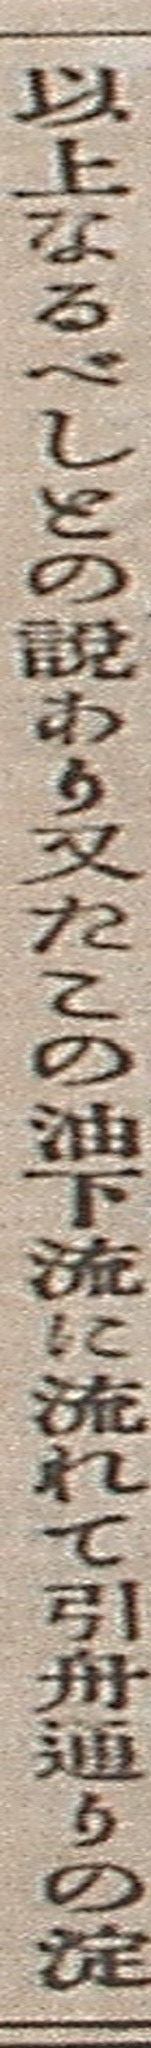以上なるべしとの説あり又たこの油下流に流れて引舟通りの淀

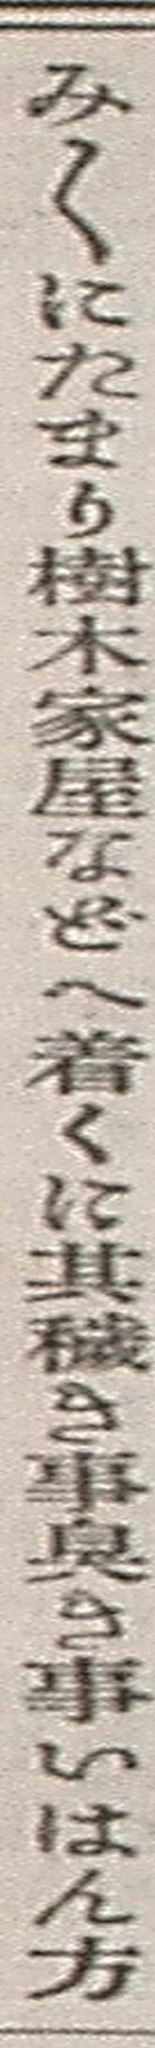み〳〵にたまり樹木家屋などへ着くに其穢き事臭き事いはん方
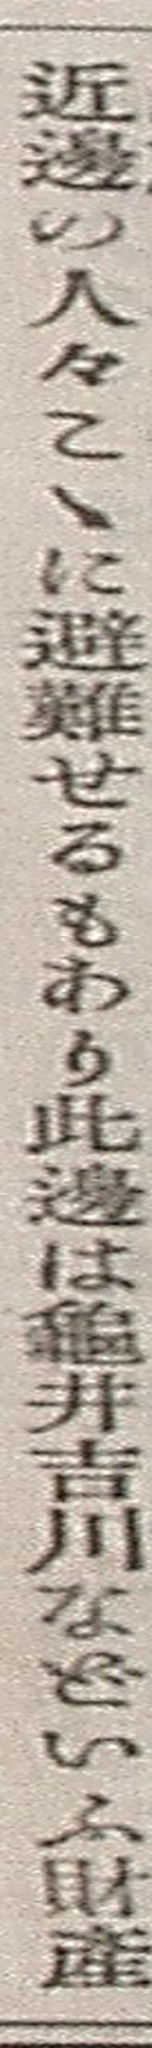近辺の人々こゝに避難せるもあり此辺は亀井吉川などいふ財産
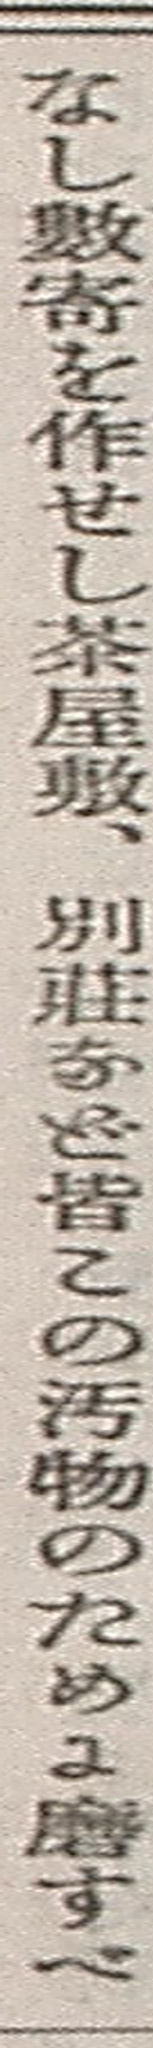なし数寄を作せし茶屋敷、別荘など皆この汚物のために磨すべ
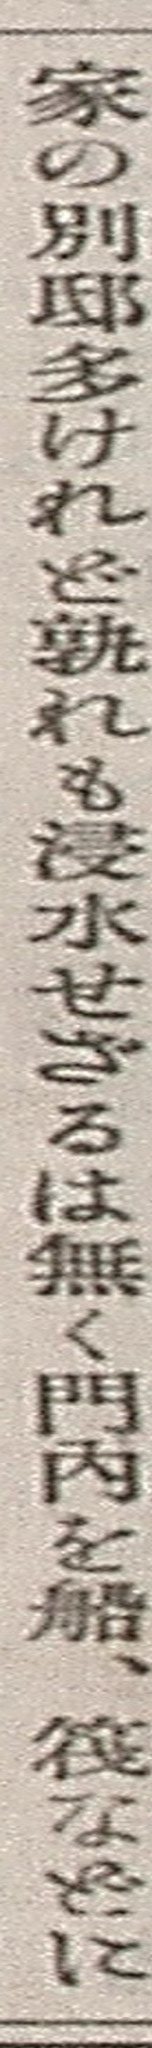家の別邸多けれど孰れも浸水せざるは無く門内を船、筏などに
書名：風俗畫報臨時増刊第百二十四號　洪水地震被害録（上）
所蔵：東京大学地震研究所図書室 Earthquake Research Institute Library, The University of Tokyo, JAPAN
